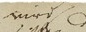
istwird auch
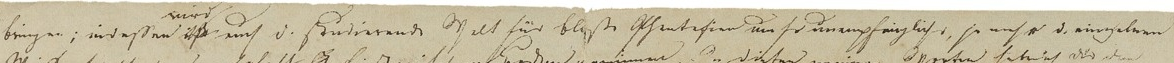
studierende Welt für bloße Phantasien um so unempfänglicher, je mehr d. einzelnen
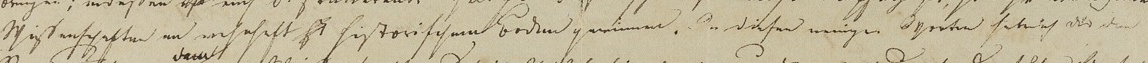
Wissenschaften an wahrhaft historischem Boden gewinnen. In diesen wenigen Worten hebe ich dir
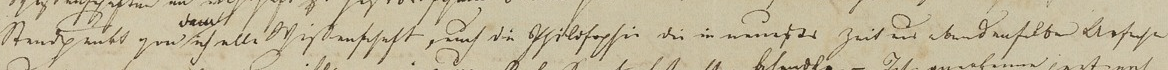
Standpunkt von dem ich alle Wissenschaft, auch die Philosophie die in neuester Zeit aus eben denselben Ursachen
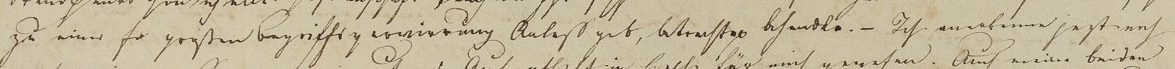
zu einer so großen Begriffsverwirrung Anlass gab, betrachte & behandle. – Ich anerkenne jezt noch
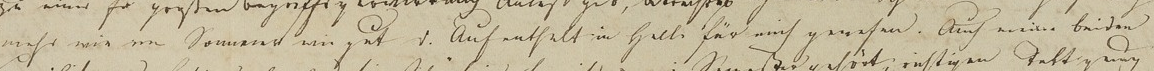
mehr wie im Sommer wie gut d. Aufenthalt in Halle für mich gewesen. Auch meine beiden
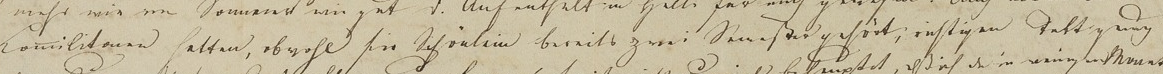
Commilitonen hatten, obwohl sie Schönlein bereits zwei Semester gehört, richtigen Takt genug
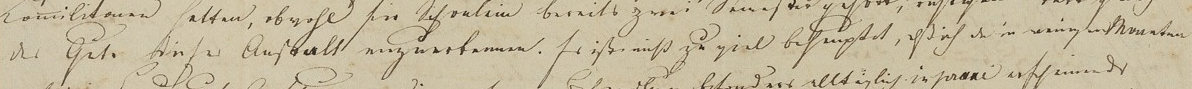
das Gute dieser Anstalt anzuerkennen. Es ist nicht zu viel behauptet, dß ich da in wenigen Monaten
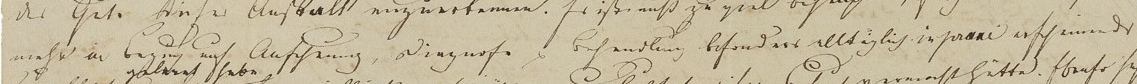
mehr in Bezug auf Anschauung, Diagnose & Behandlung besonders alltäglich in praxi erscheinender
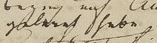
gelernt habe
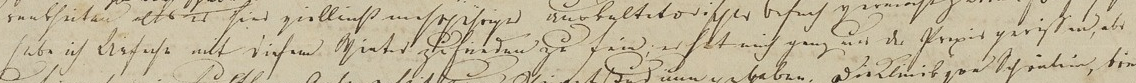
habe ich Ursache mit diesem Winter zu frieden zu sein; er hat mich ganz aus der Praxis gerissen, aber
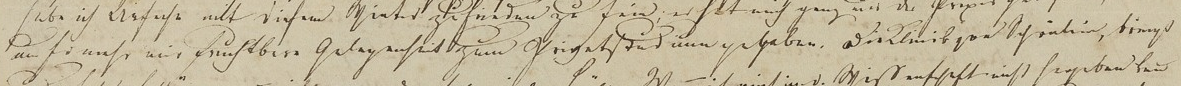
um so mehr mir fruchtbare Gelegenheit zum Privatstudium gegeben. Die Klinik von Schönlein, bringt
